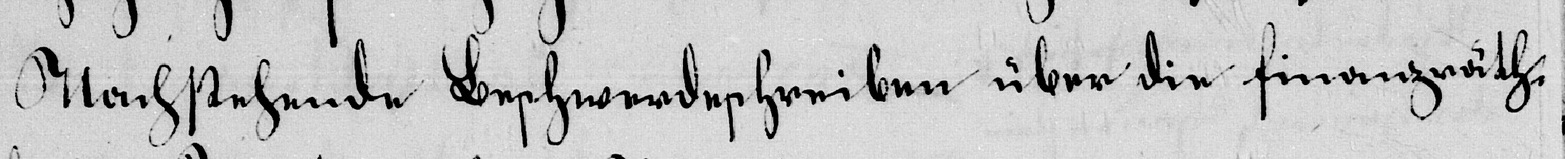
Nachstehende Beschwerdeschreiben über die finanzräth¬
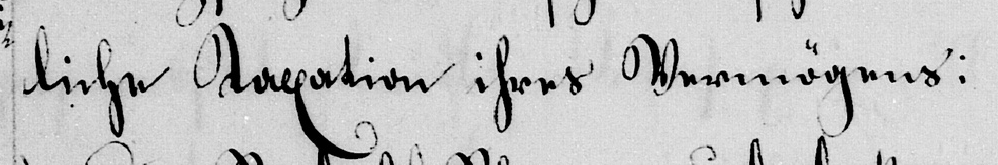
liche Taxation ihres Vermögens:
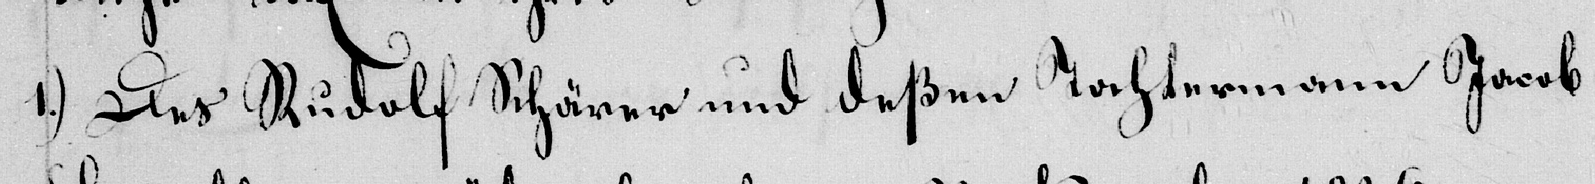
1.) Des Rudolf Schärer und deßen Tochtermann Jacob
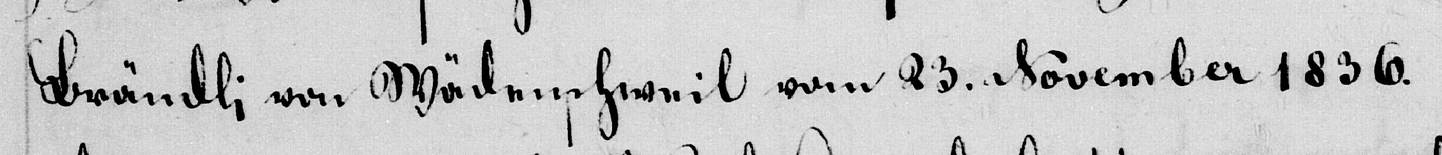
Brändli von Wädenschweil vom 23. November 1836.
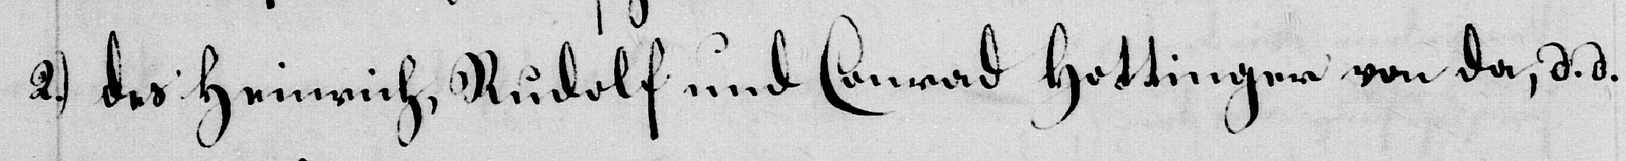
2.) des Heinrich Rudolf und Conrad Hottinger von da, d. d.
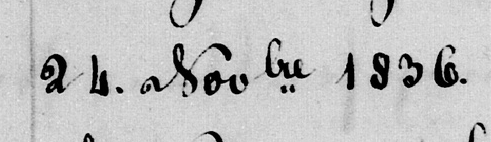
24. Novbre 1836.
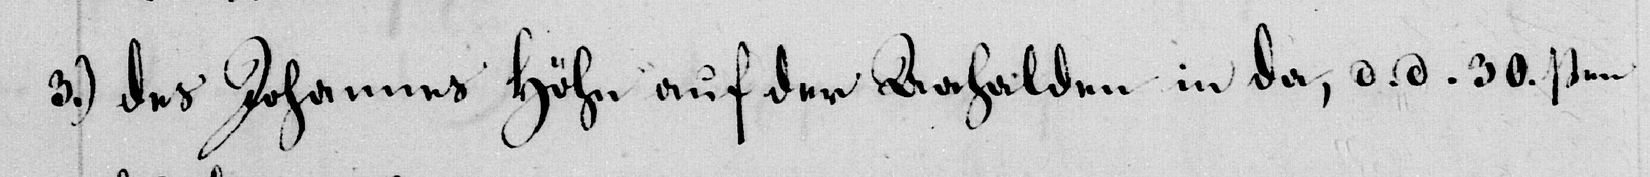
3.) des Johannes Höhn auf der Aahalden in da, d. d. 30.sten
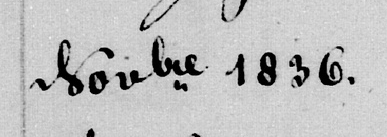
Novbre 1836.
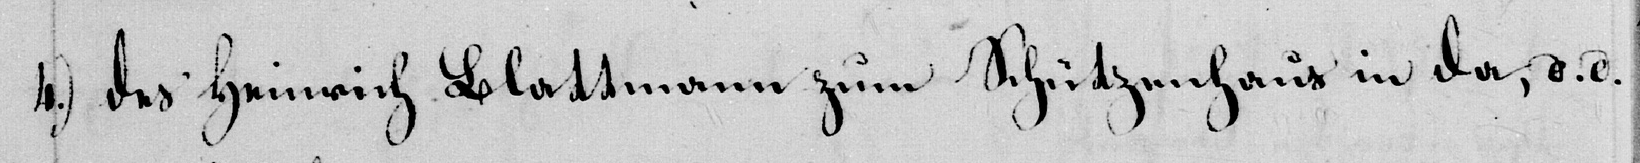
4.) des Heinrich Blattmann zum Schützenhaus in da, d. d.
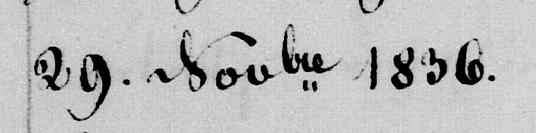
29. Novbre 1836.
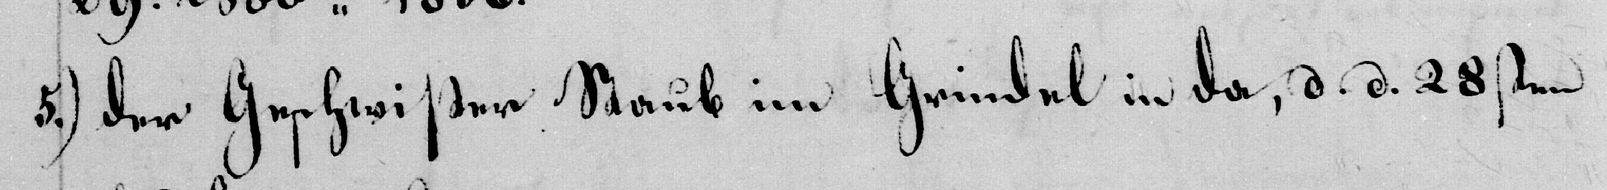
5.) der Geschwister Staub im Grindel in da, d. d. 28sten
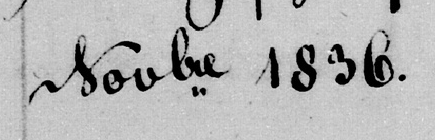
Novbre 1836.
